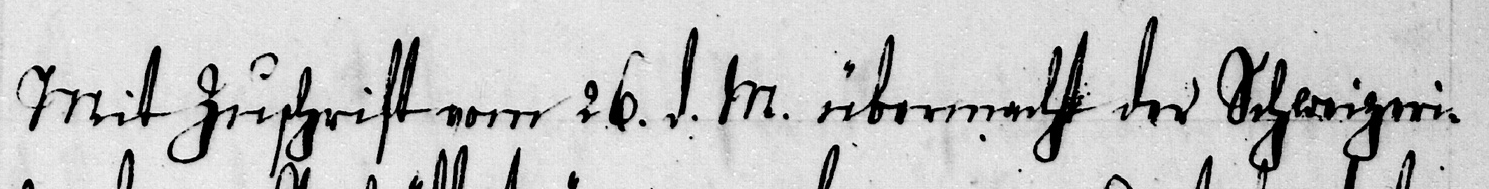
Mit Zuschrift vom 26 .d. M. übermacht der Schweizeri¬
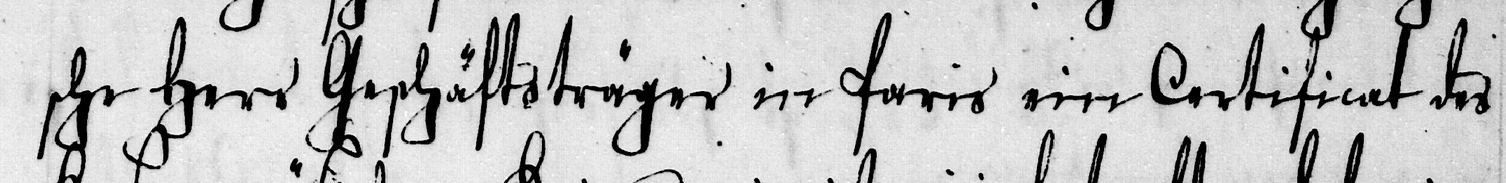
sche Herr Geschäftsträger in Paris ein Certificat des
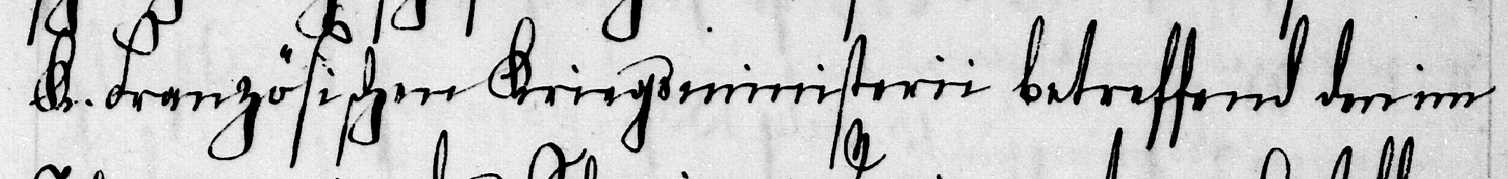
K. Französischen Kriegsministerii betreffend den im
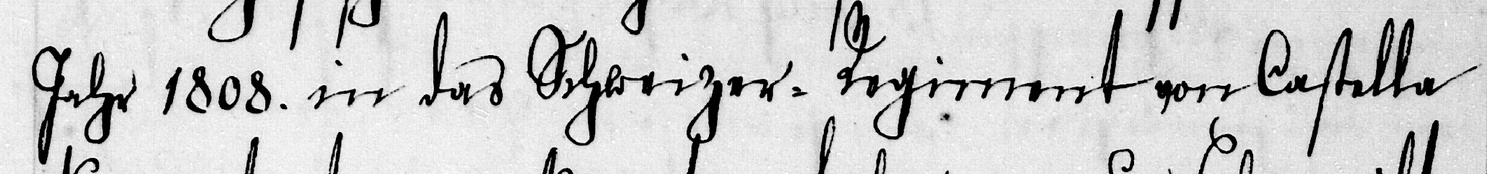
Jahr 1808. in das Schweizer-Regiment von Castella
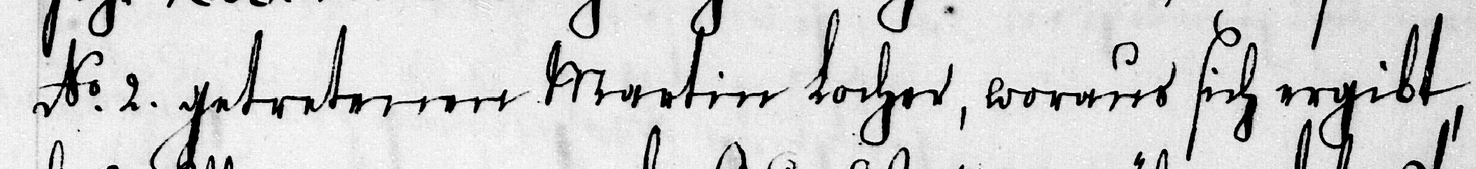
No. 2. getretenen Martin Locher, woraus sich ergibt,
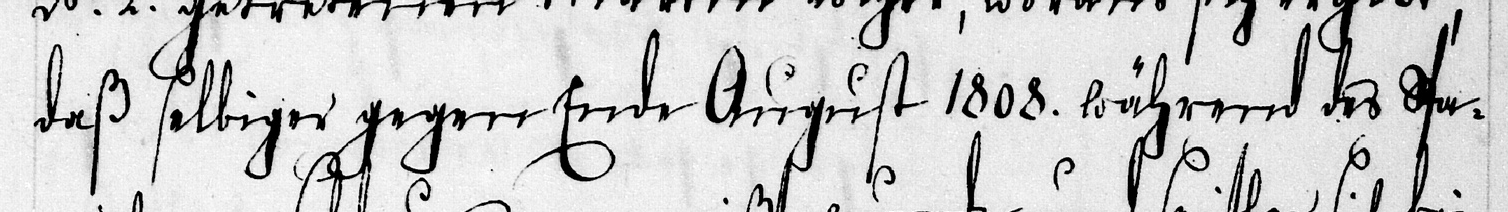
daß selbiger gegen Ende August 1808. während des Spa¬
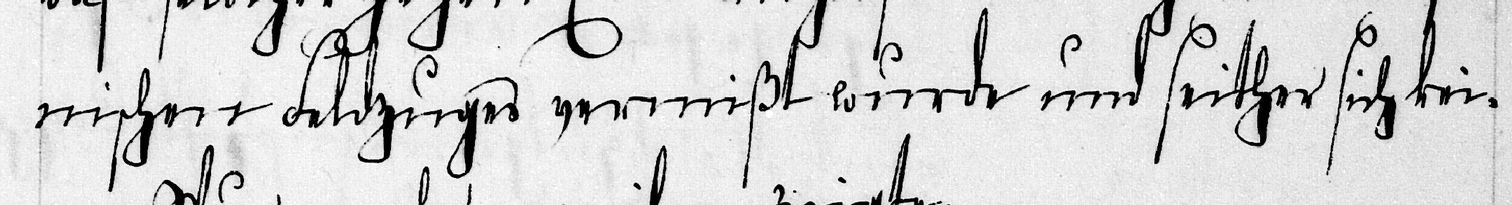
nischen Feldzuges vermißt wurde und seither sich kei¬
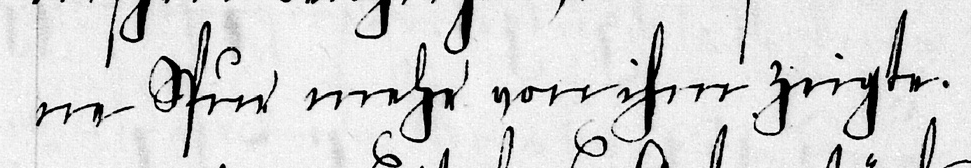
ne Spur mehr von ihm zeigte.
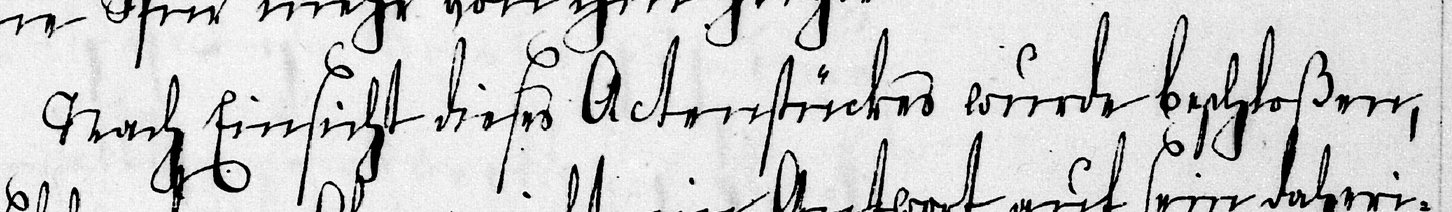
Nach Einsicht dieses Actenstückes wurde beschloßen,
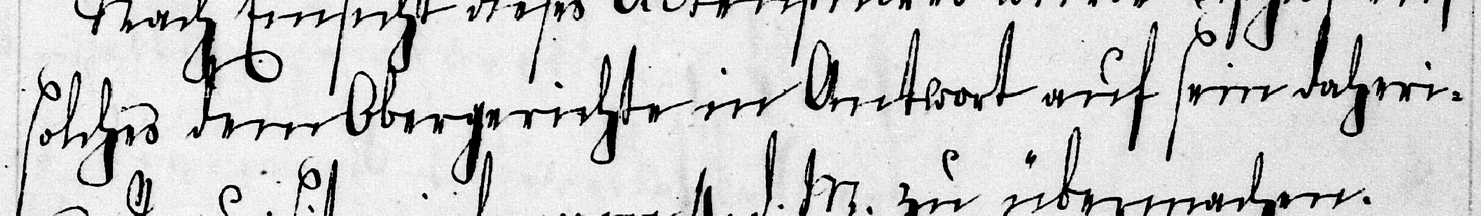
solches dem Obergerichte in Antwort auf sein daheri¬
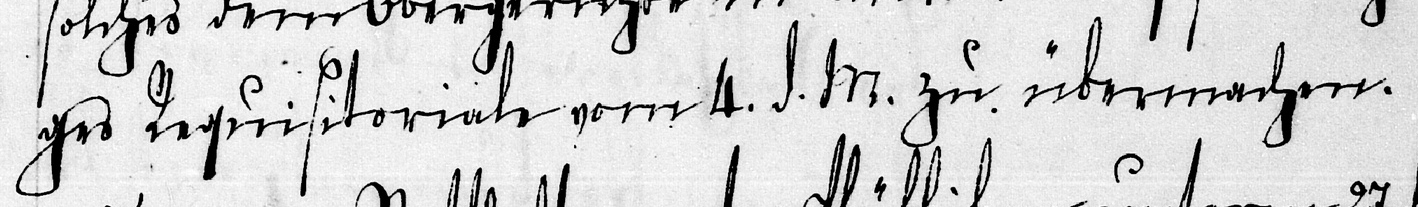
ges Requisitoriale vom 4. d. M. zu übermachen.
